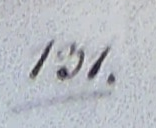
131.
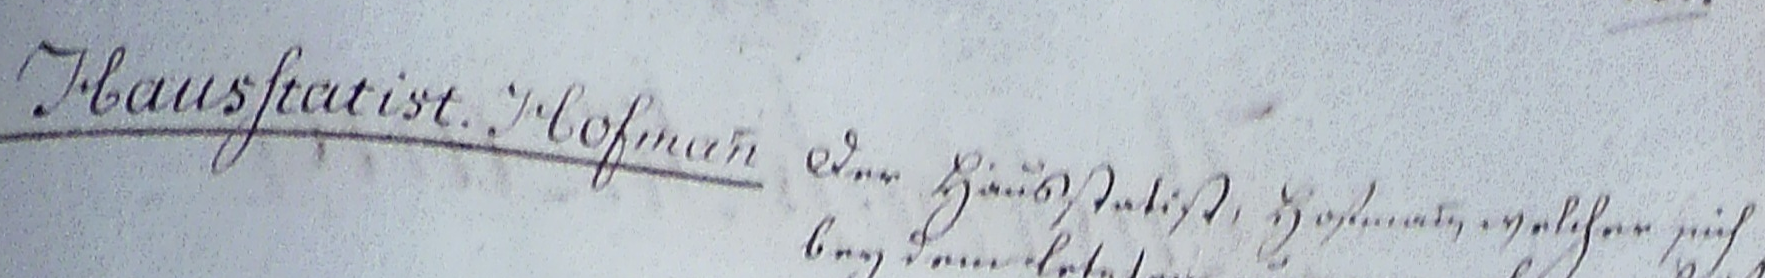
Hausstatist. Hofman Der Hausstatist, Hofman, welcher sich
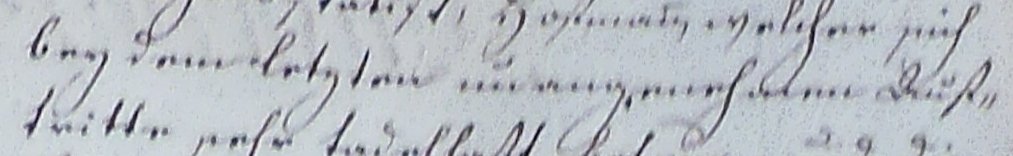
bey dem letzten unangenehmen Auf¬
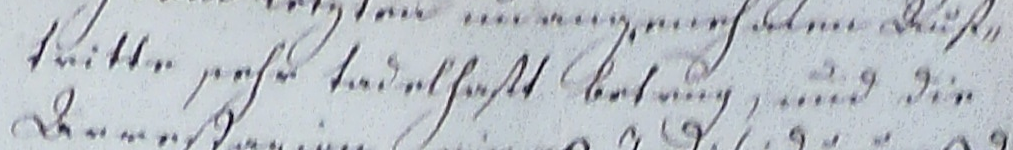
tritte sehr tadelhaft betrug, und die
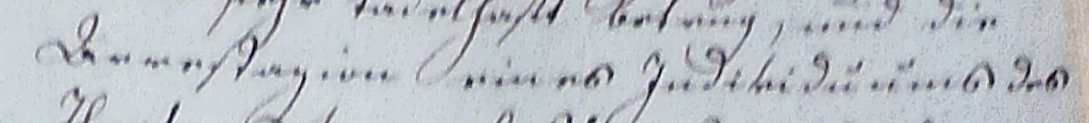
Arrestazion eines Individuums des
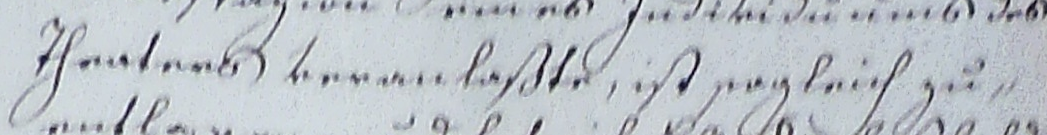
Theaters veranlaßte, ist sogleich zu¬
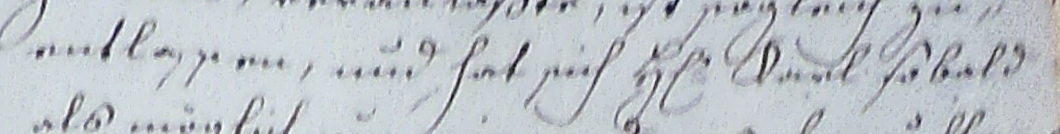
entlassen, und hat sich HEr͇ Karl sobald
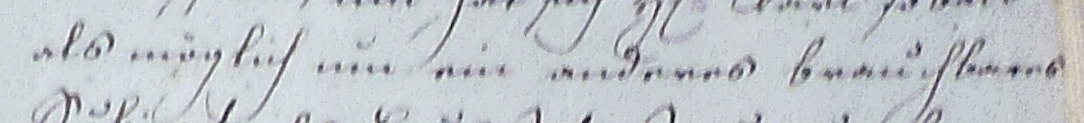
als möglich um ein anderes brauchbares
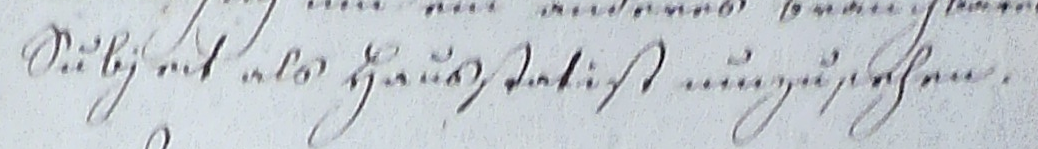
Subject als Hausstatist umzusehen.
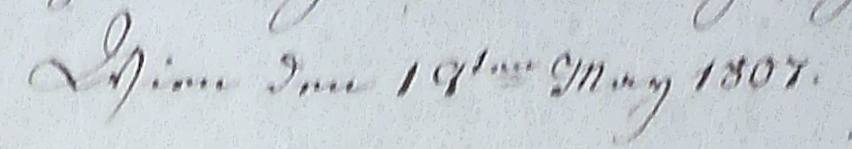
Wien den 19te͇n May 1807.
